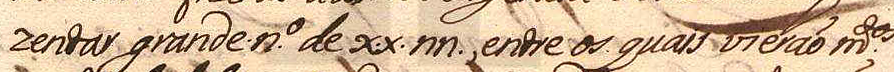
zentar grande n.o de xx. nn. entre os quais vieraõ m.tos
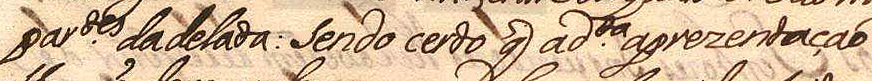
par.tes da delata: sendo certo q̄ a d.ta aprezentaçaõ
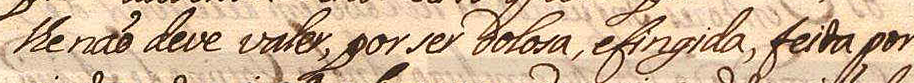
lhe naõ deve valer, por ser dolosa, e fingida, feita por
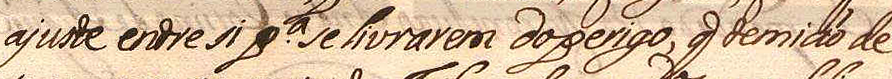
ajuste entre si p.a se livrarem do perigo, q̄ temiaõ de
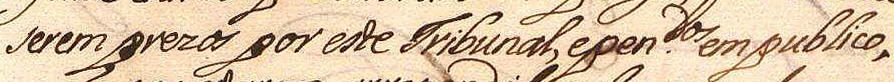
serem prezos por este Tribunal, e pen.dos em publico,
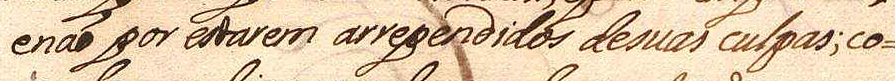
e naõ por estarem arrependidos de suas culpas; co
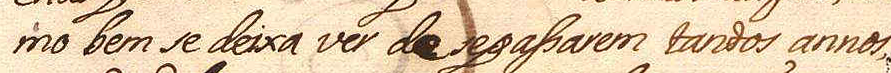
mo bem se deixa ver de se passarem tantos annos,
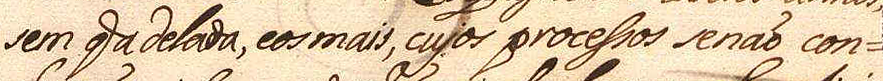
sem q̄ a delata, e os mais, cujos processos se naõ con
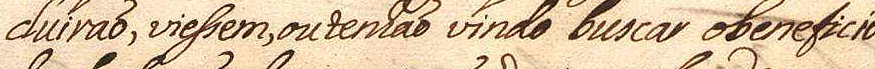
cluiraõ, viessem, ou tenhaõ vindo buscar o beneficio
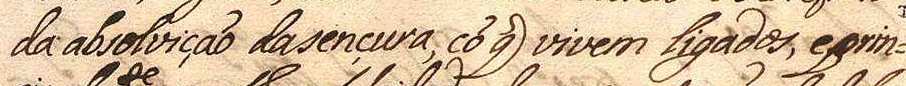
da absolviçaõ da sençura, cō q̄ vivem ligados, e prin
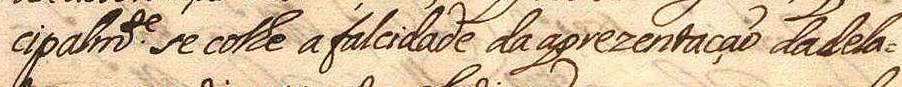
cipalmt.e se colhe a falcidade da aprezentaçaõ da dela
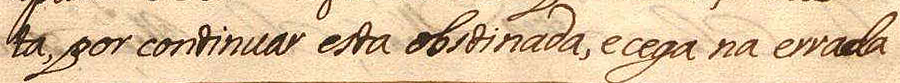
ta, por continuar esta obstinada, e cega na errada
